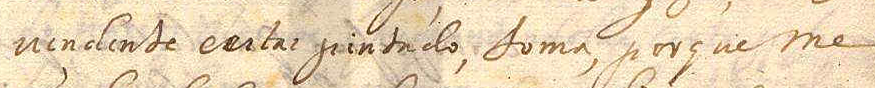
uendente, e estas pintado, toma, porque me
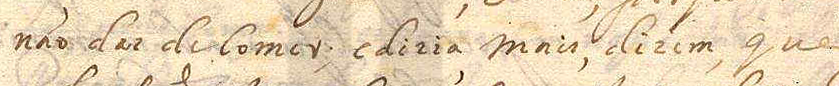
não das de Comer, e dizia mais, dizem, que
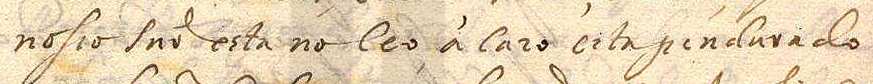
nosso snr̄ esta no Ceo, ácazo esta pendurado
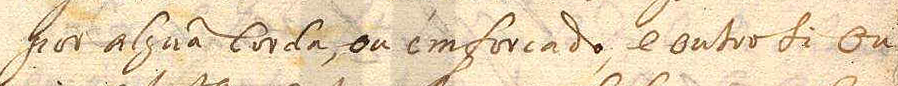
por alguā corda, ou emforcado, e outrosi ou
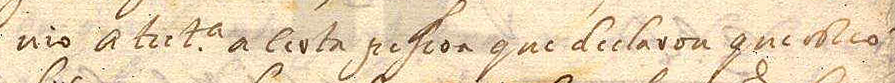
uio a test.a a certa pessoa que declarou que o Reo
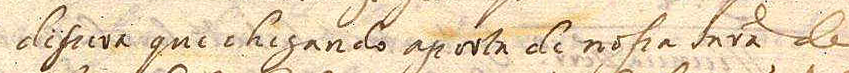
dissera que chegando a porta de nossa Snrā de
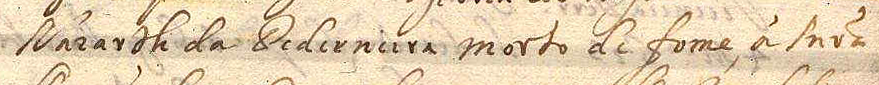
Nazarth da Pederneira morto de fome, à Snrā
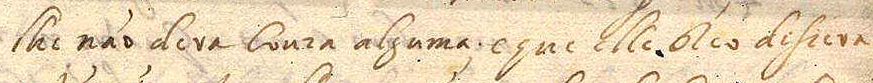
lhe naõ dera couza alguma, e que elle Reo dissera
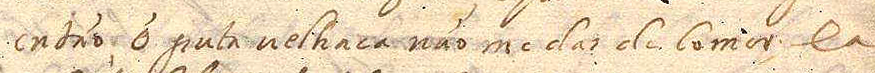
entaõ, ó puta uelhaca naõ me das de Comer; e a
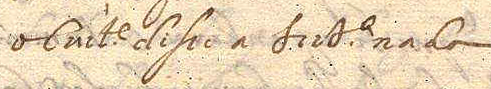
o Cust.e disse a test.a nada
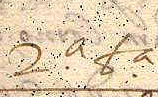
2.a t.a
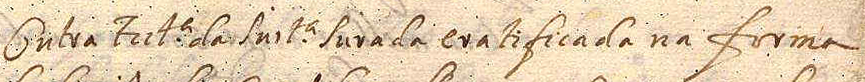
Outra test.a da Iust.a Iurada e ratificada na forma
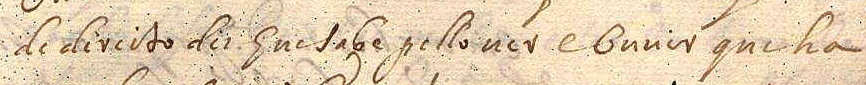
de direito dis que sabe pello uer e Ouuir que ha
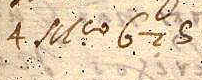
4. M.co 675
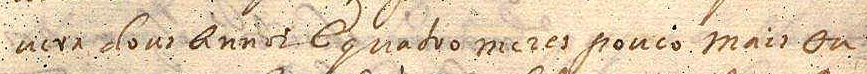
uera dous annos E quatro mezes pouco mais ou
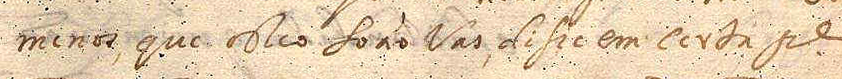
menos, que o Reo Joaõ Vas, disse em certa p.e
